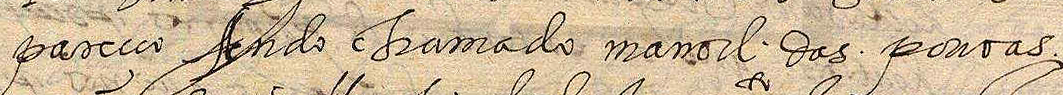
pareceo sendo chamado manoel das pouoas
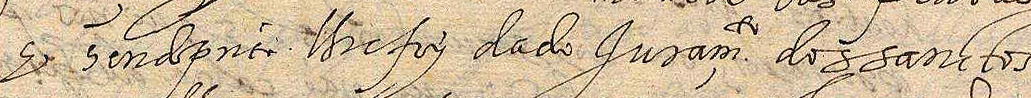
E sendo pnto lhe foy dado Juramto dos sanctos
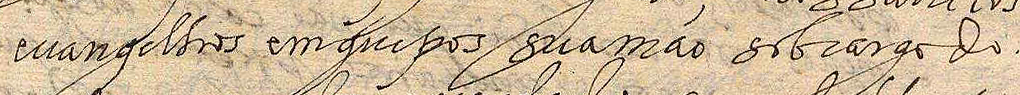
euangelhos em que pos sua mão sob cargo do
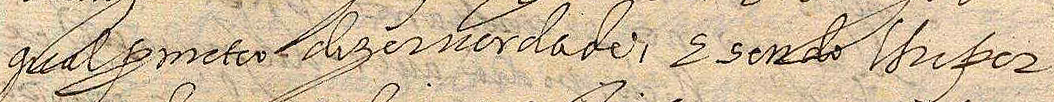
qual ꝓmeteo dizer uerdade. E sendo lhe per
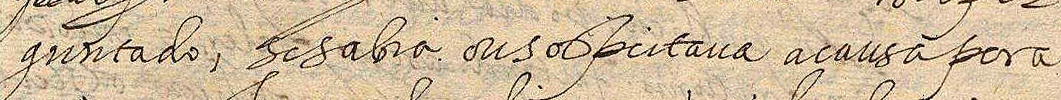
guntado, se sabia ou sospeitaua a causa pera
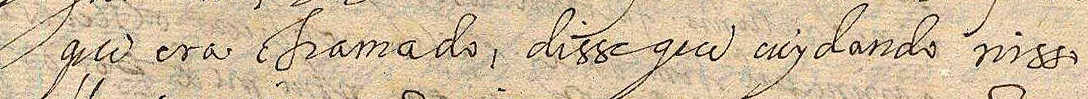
que era chamado, disse que cuydando nisso
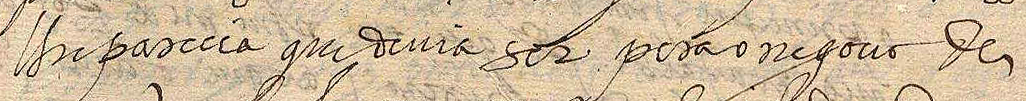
lhe parecia que deuia ser pera o negocio de
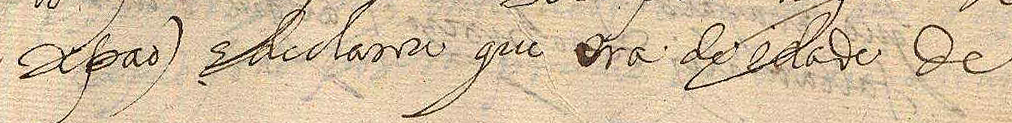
xpaõ E declarou que era de idade de
